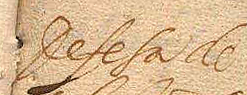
Defesa de
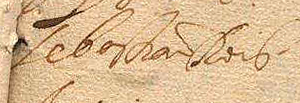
sebastiaõ Rois̄
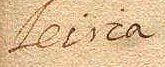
Leiria
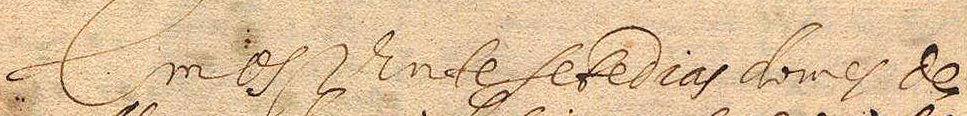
Em os Vinte sete dias do mes de
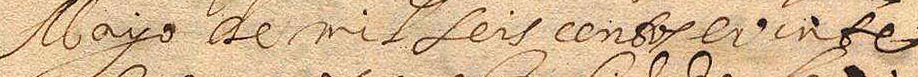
Mayo de mil seiscentos e vinte
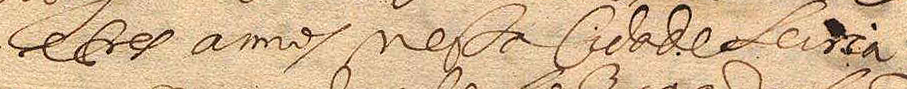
e tres annos nesta Cidade Leiria
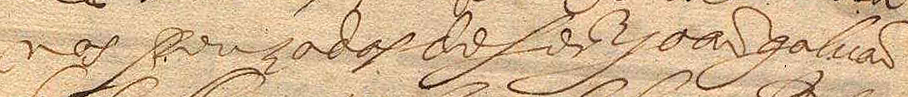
nas pouzadas do sor̄ joaõ galuaõ
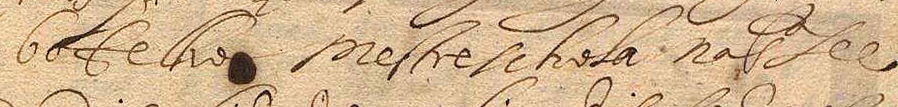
botelho mestre schola na sta see
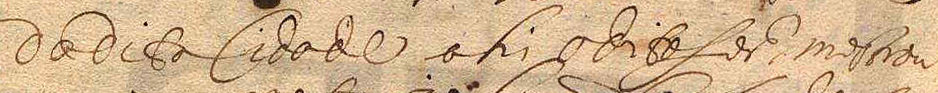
da dita Cidade ahi o dito sor̄ mostrou
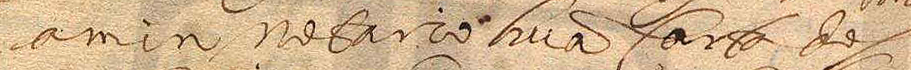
a min notario huā Carta dos
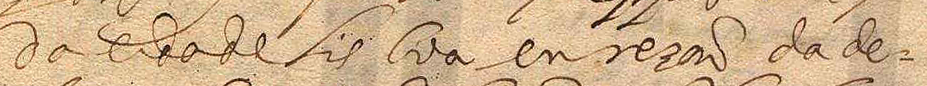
da cidade Lisboa en rezaõ da de
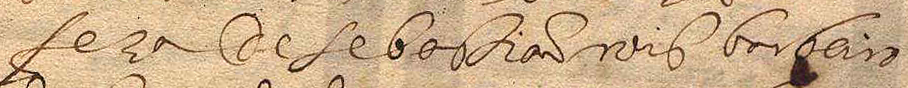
feza de sebastiaõ rois̄ barbeiro
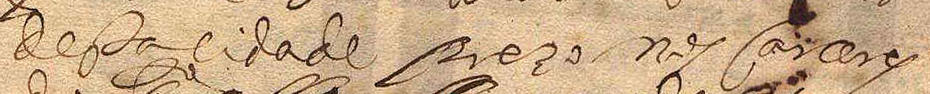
desta cidade prezo nos Carceres
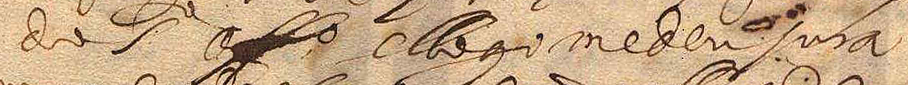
do sto off.o e llogo me deu jura
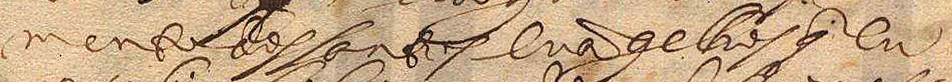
mento dos santos euāgelhos q̄ eu
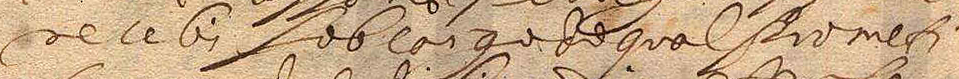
recebi sob cargo do qual prometi
